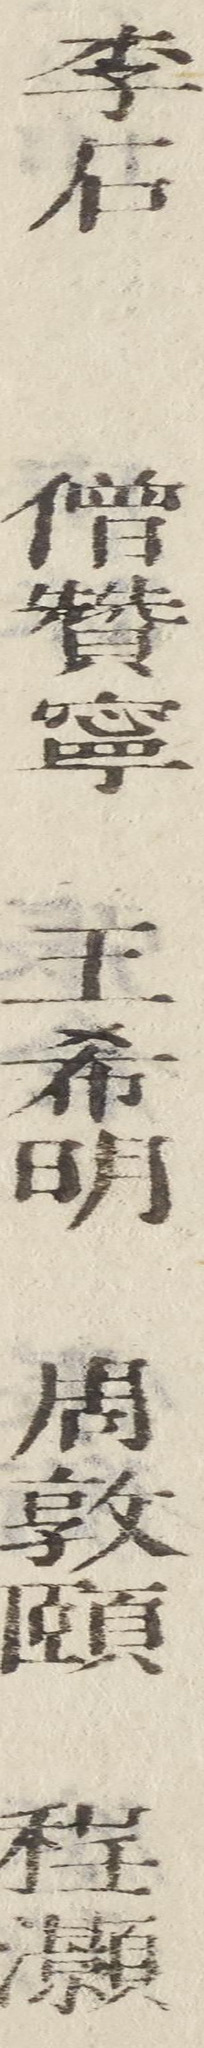李石僧贊寧王希明周敦頤程灝
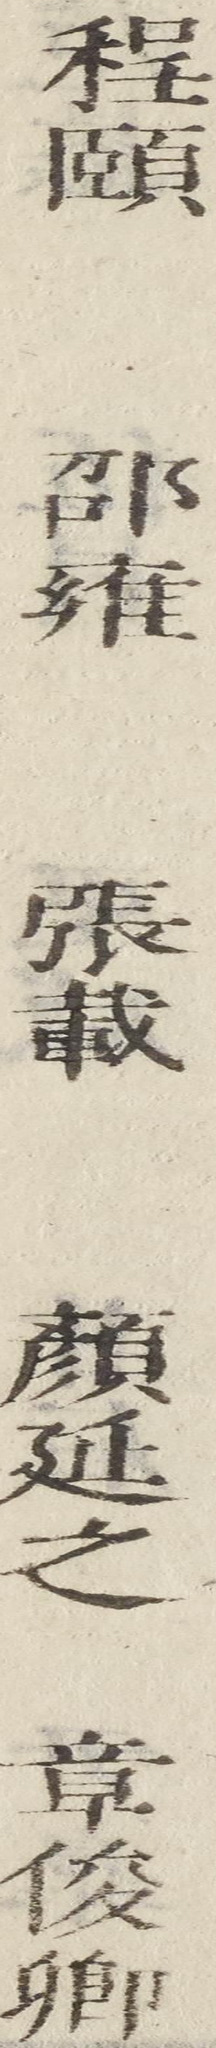程頤邵雍張載顔延之章俊卿
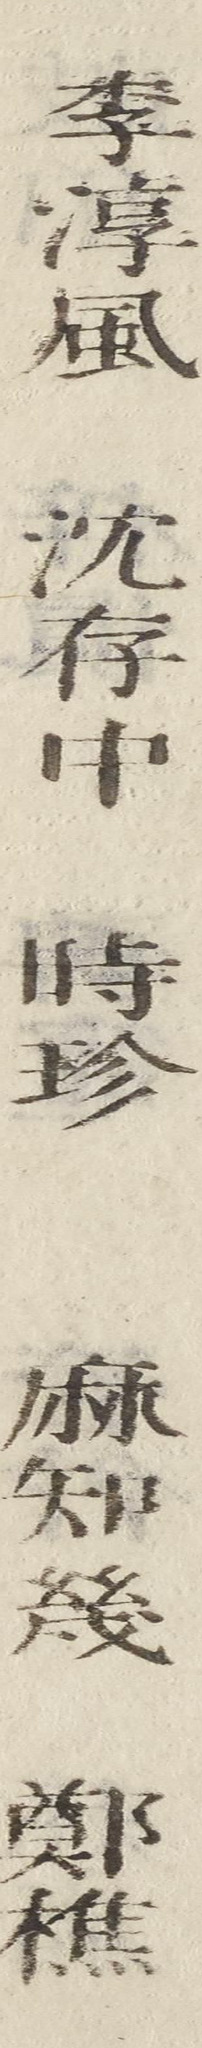李淳風沈存中時珍麻知幾鄭樵
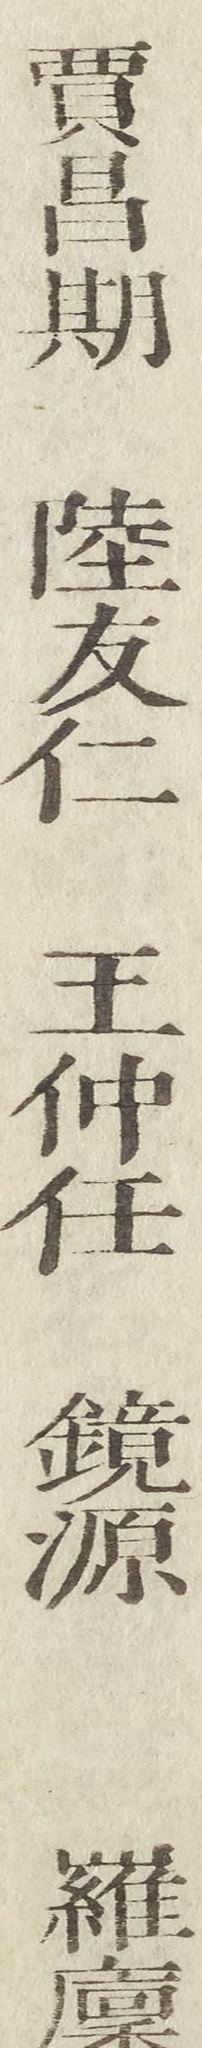賈昌期陸友仁王仲任鏡源羅廩
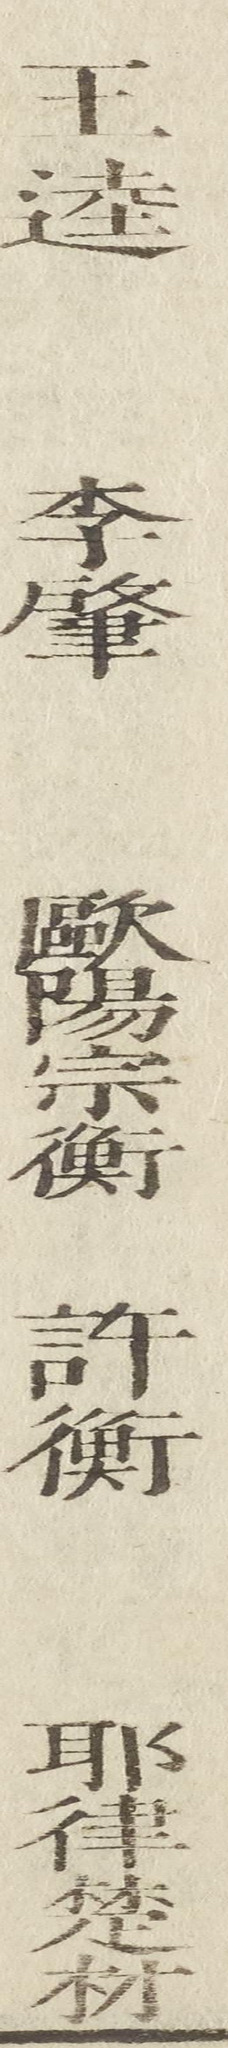王逵李肇欧陽宗衡許衡耶律楚材
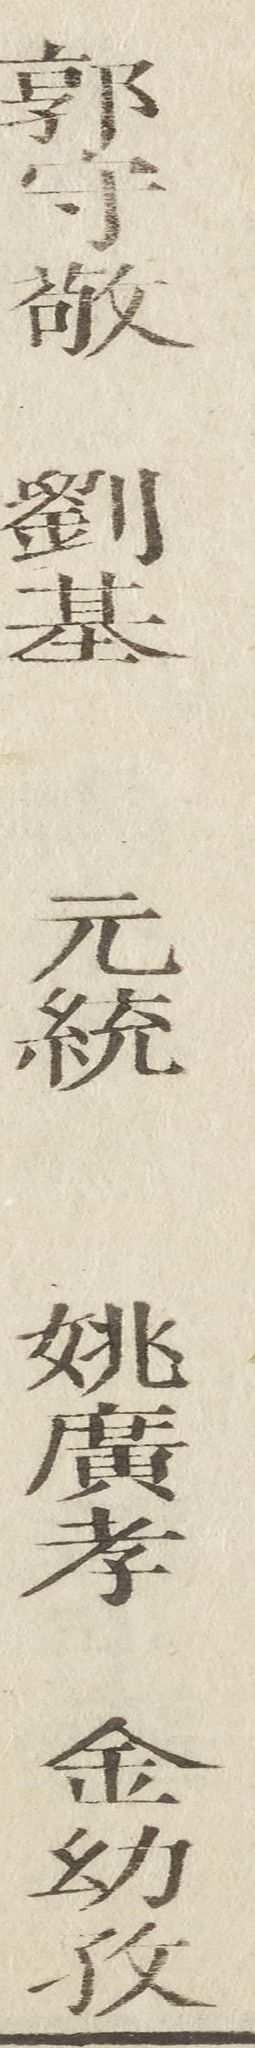郭守敬劉基元統姚廣孝金幼孜
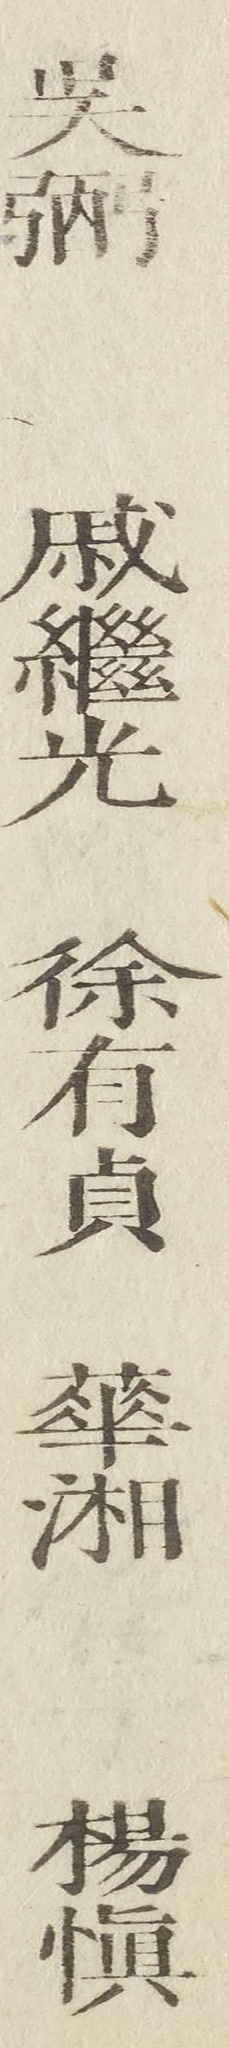呉弻戚継光徐有貞蕐湘楊愼
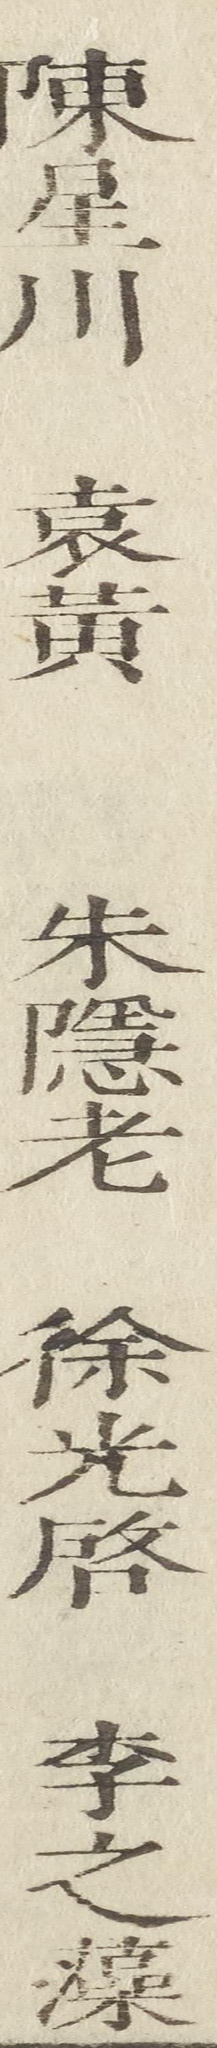陳星川袁黄朱隠老徐光啓李之藻
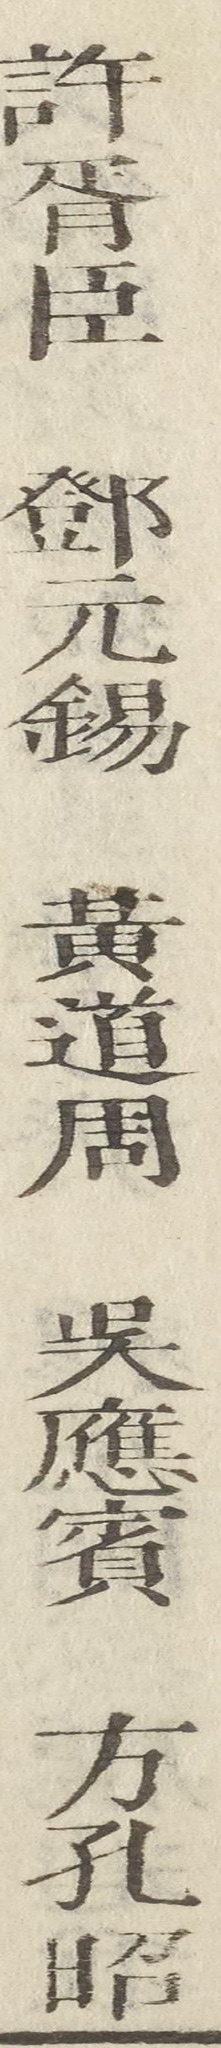許胥臣鄧元錫黄道周呉応賓方孔昭
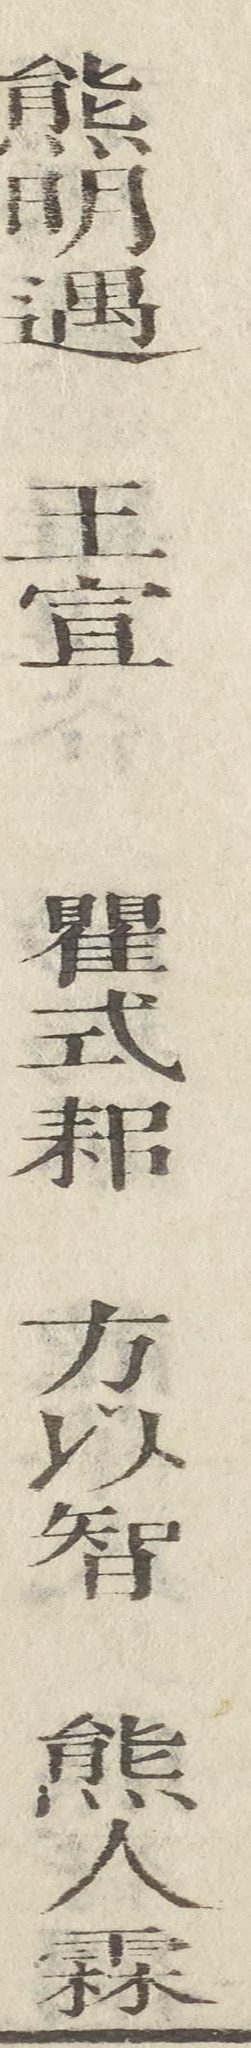熊明遇王宣瞿式耜方以智熊人霖

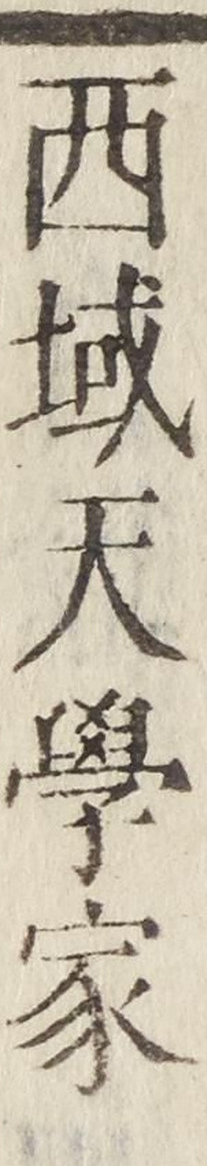西域天学家
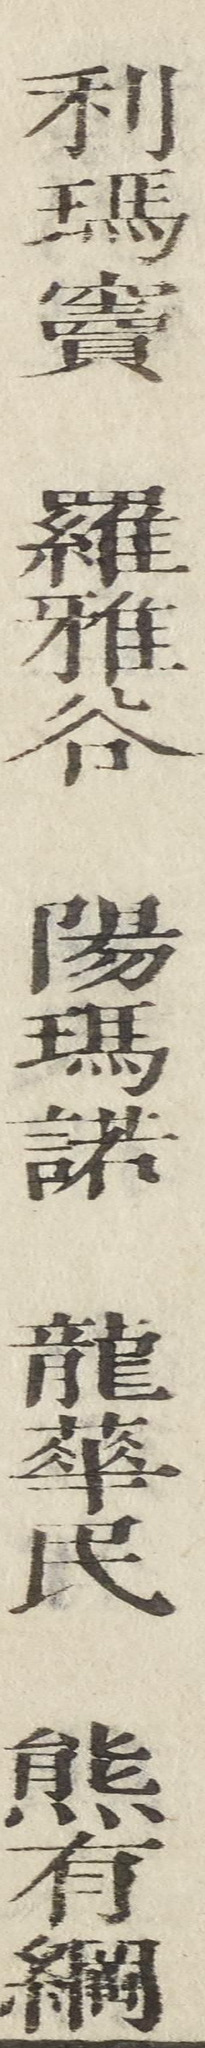利瑪竇羅雅谷陽瑪諾龍蕐民熊有綱
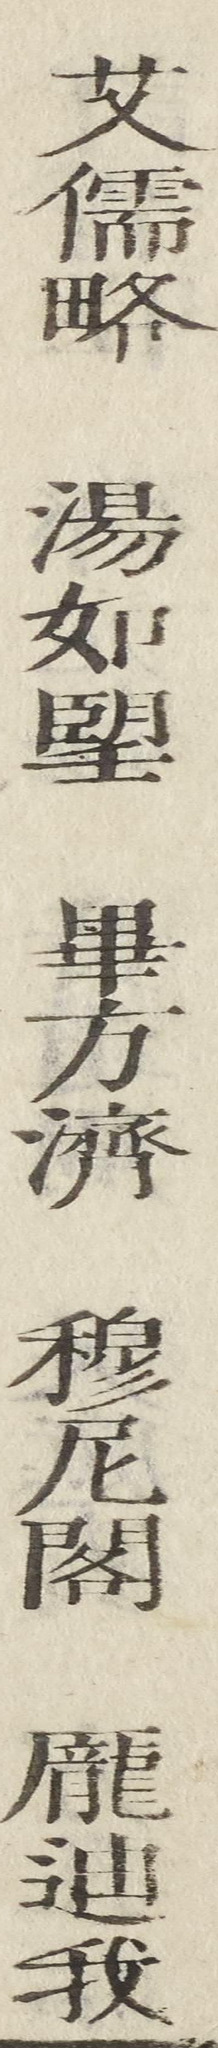艾儒略湯如朢畢方濟穆尼閣龐迪我
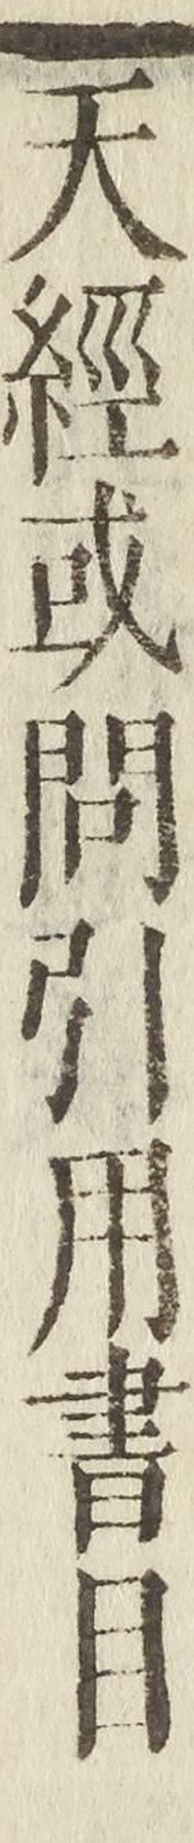天経或問引用書目

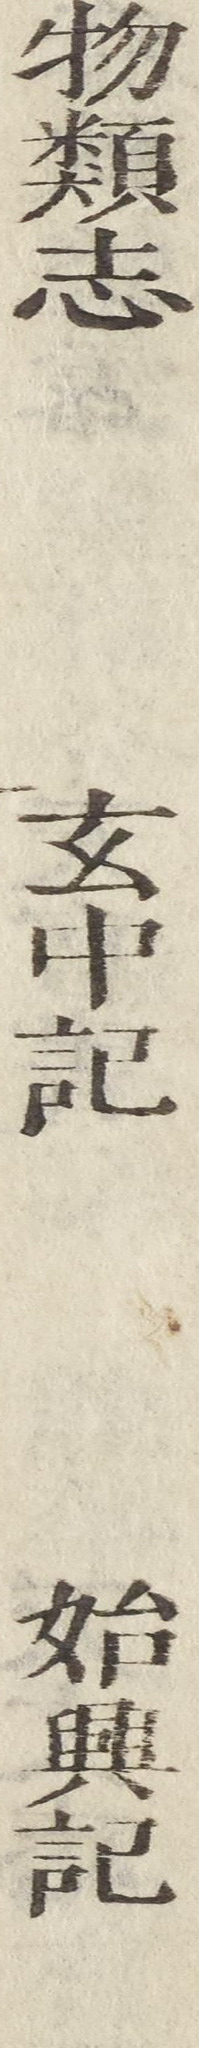物類志玄中記始興記
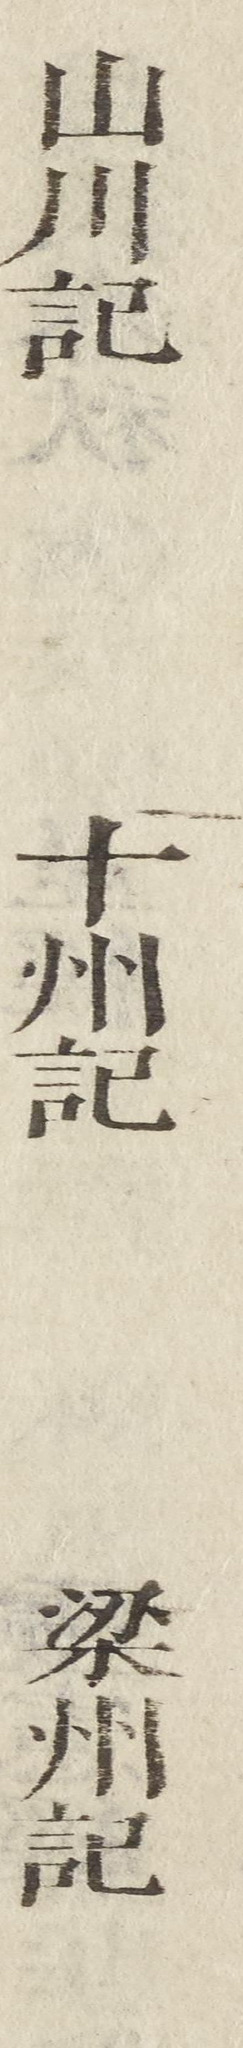山川記十州記梁州記
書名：天經或問　序圖
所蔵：東京大学地震研究所図書室 Earthquake Research Institute Library, The University of Tokyo, JAPAN
